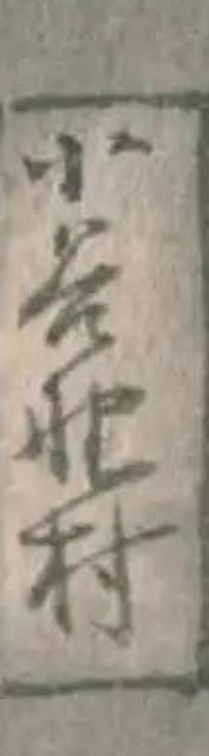小谷野村
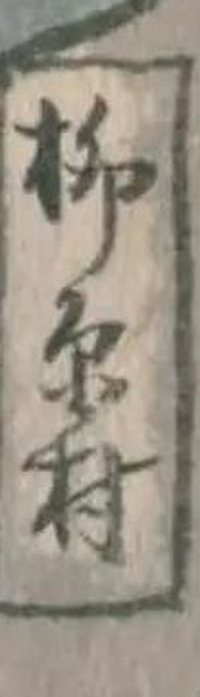柳原村
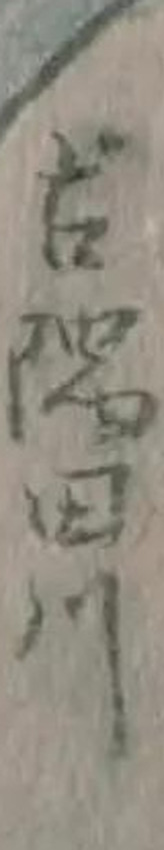古隅田川

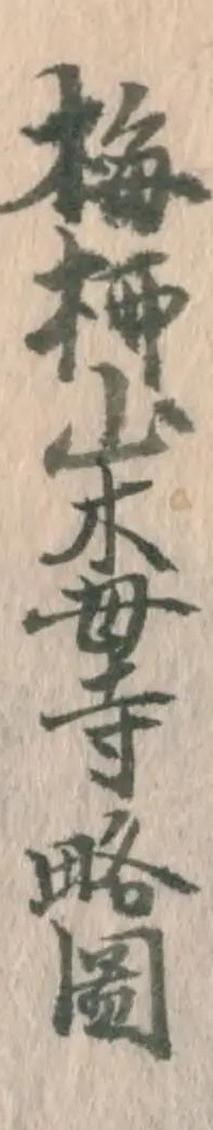梅柳山木母寺略図
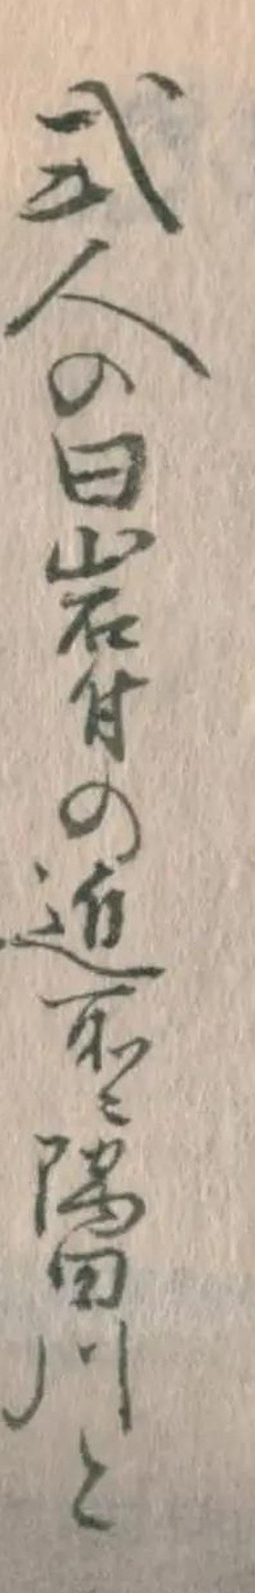弐人の曰岩付の近所に隅田川と
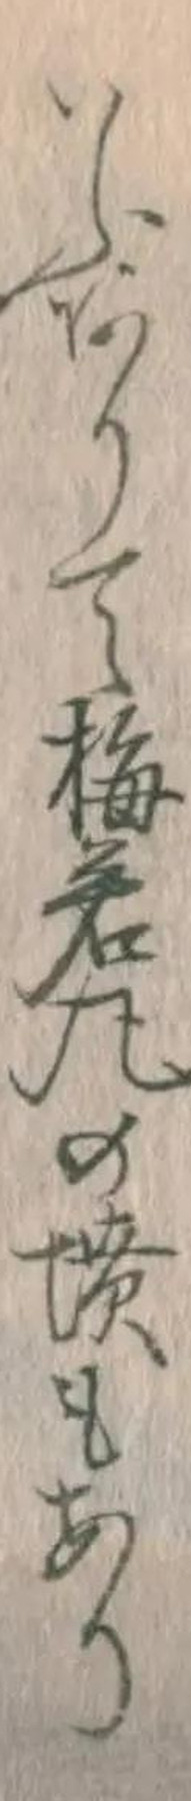いふありて梅若丸の墳もあり
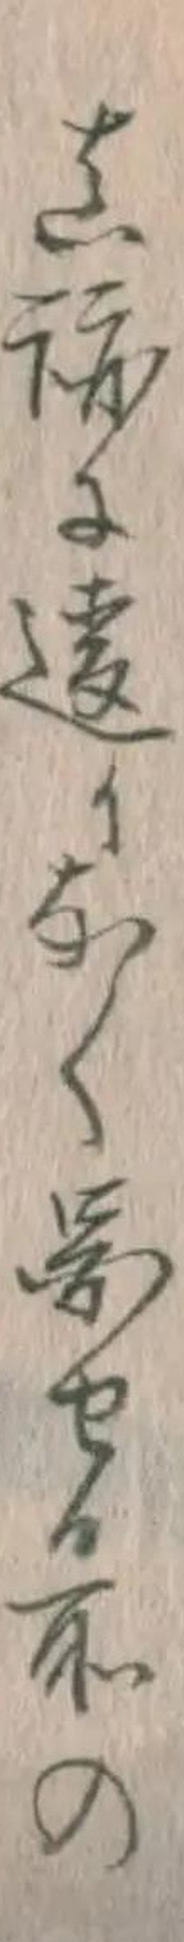真跡に違いなく図せる所の
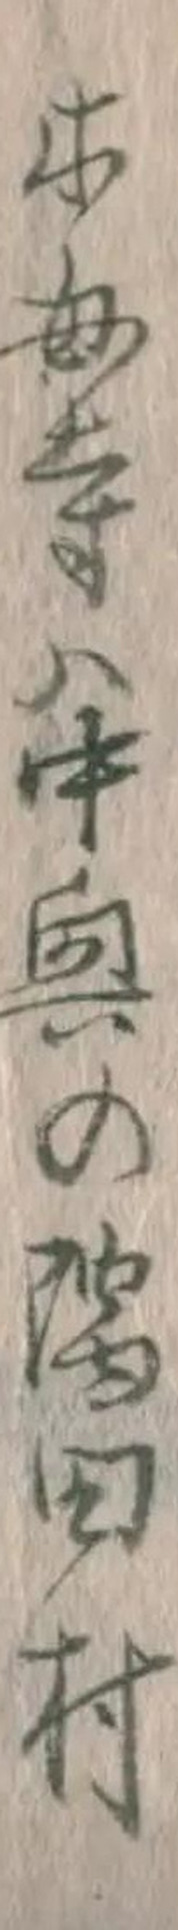木母寺は中興の隅田村
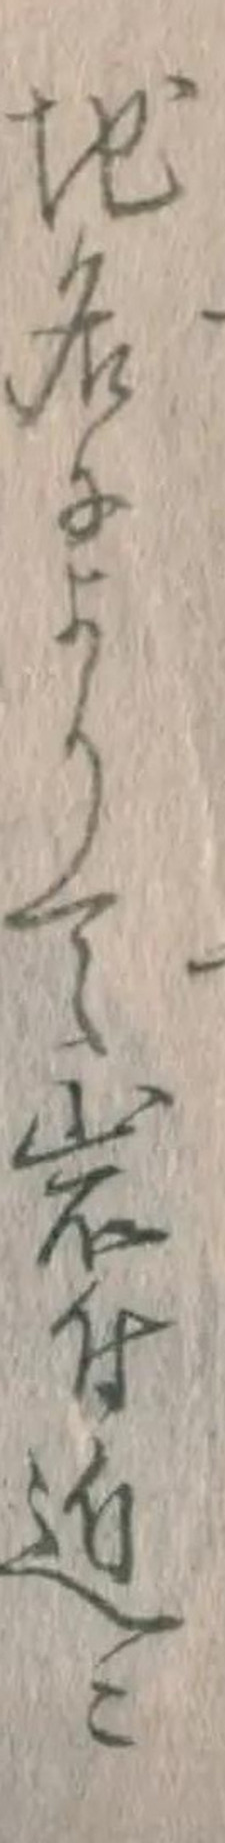地名によりて岩付近に
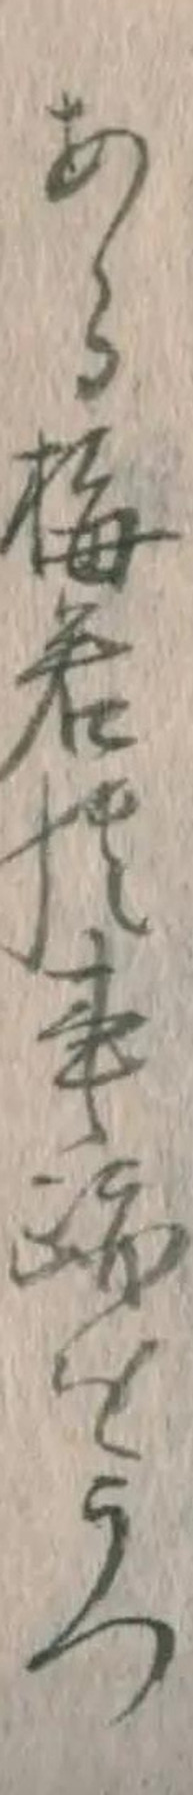ある梅若の事跡をうつ
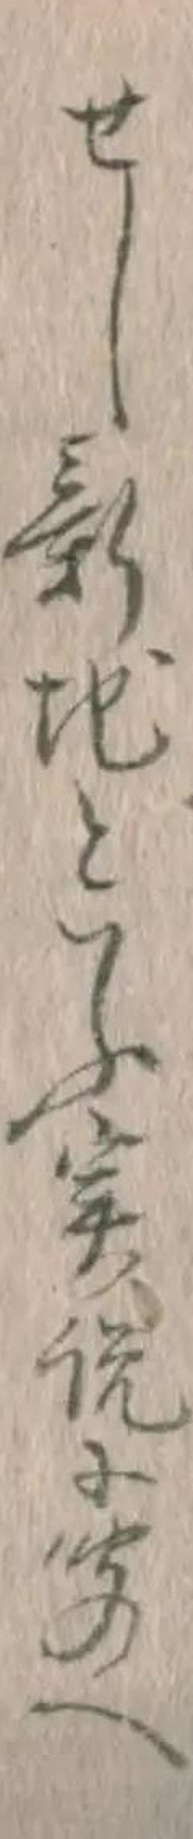せし新地といふ実説に聞へ
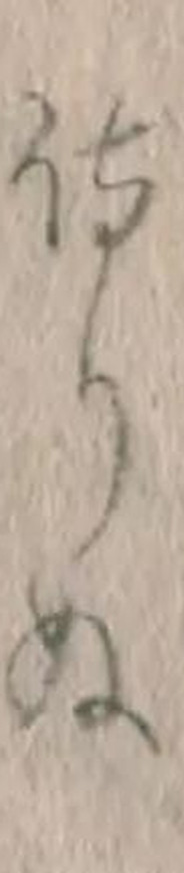侍りぬ
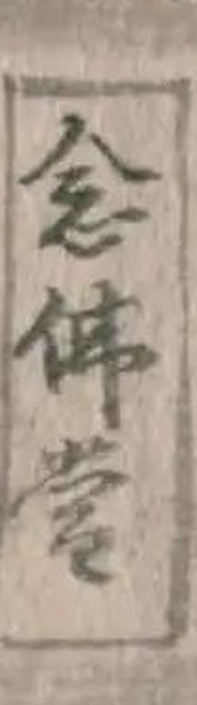念仏堂
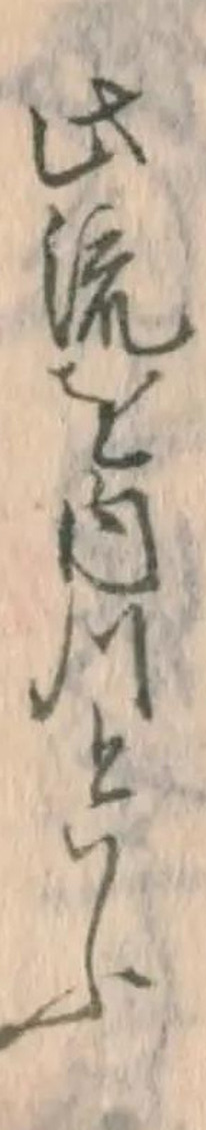此流を内川といふ
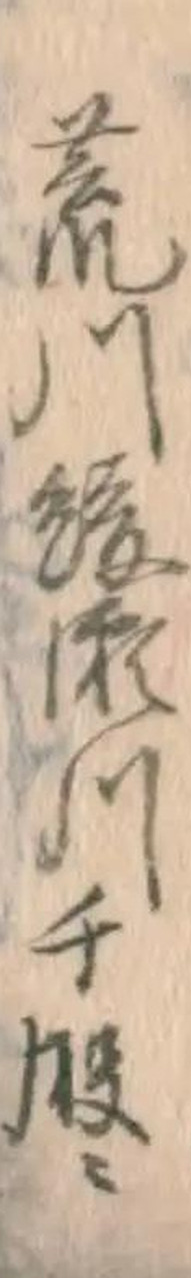荒川駿瀬川千股に
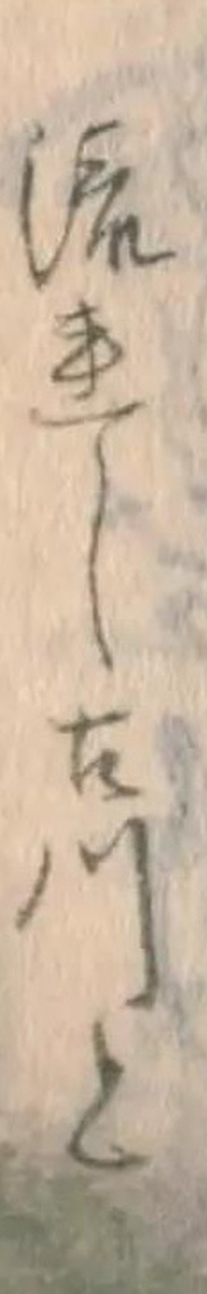流れし古川と
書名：四神地名録 6巻. [4]葛飾郡
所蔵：国立国会図書館 National Diet Library, JAPAN
